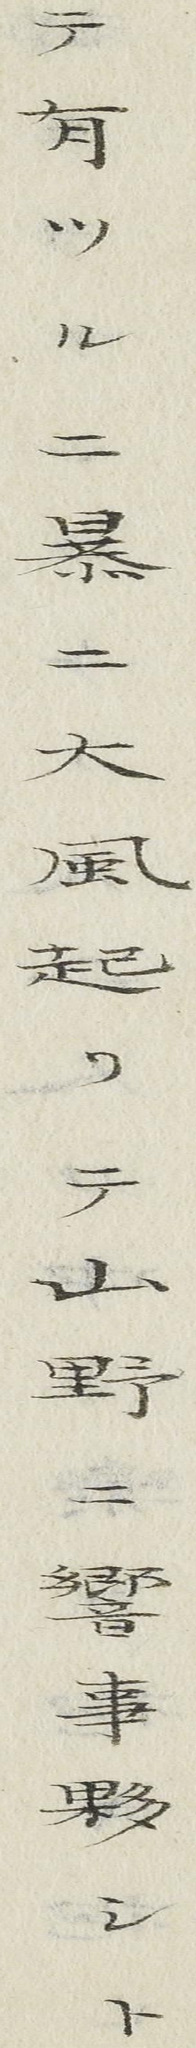テ有ツルニ暴ニ大風起リテ山野ニ響事夥シト
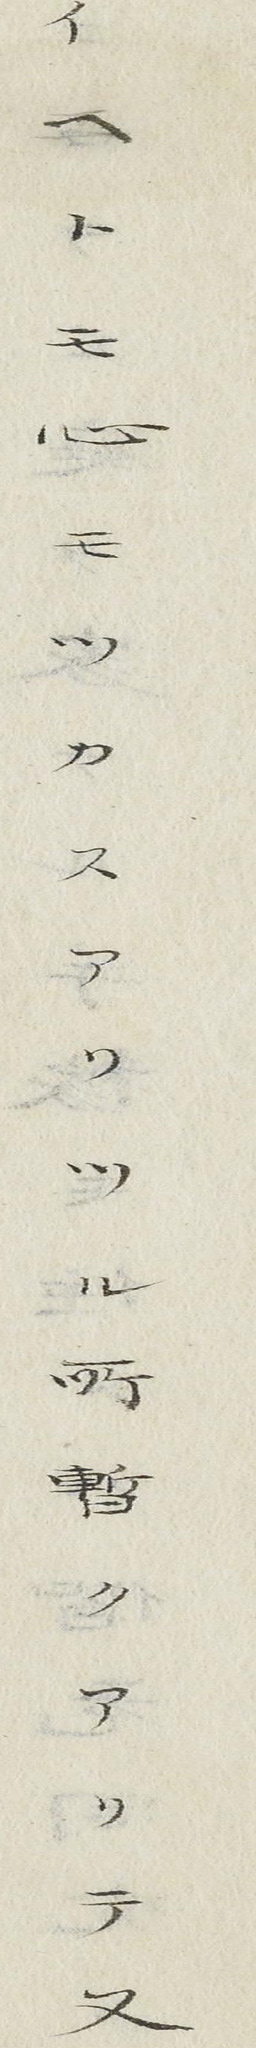イヘトモ心モツカスアリツル所暫クアリテ又
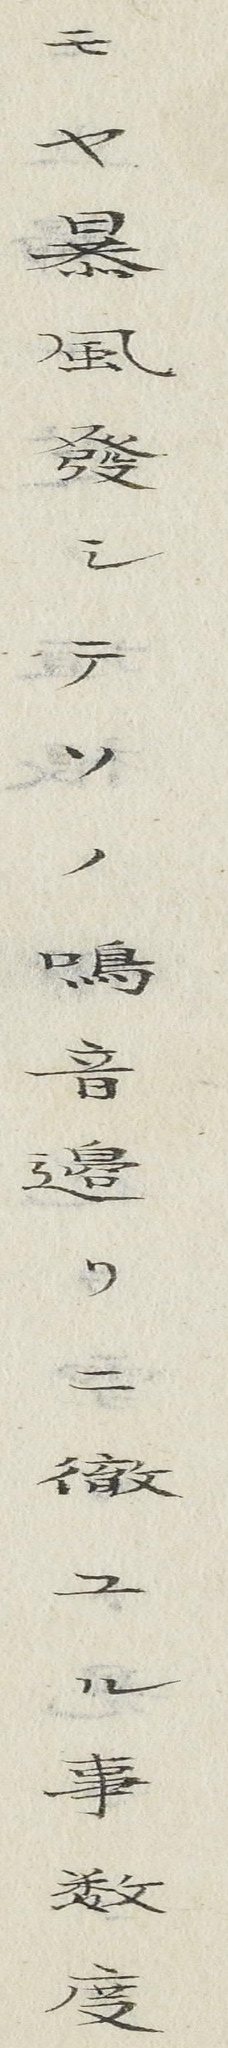モヤ暴風発シテソノ鳴音辺リニ徹ユル事数度
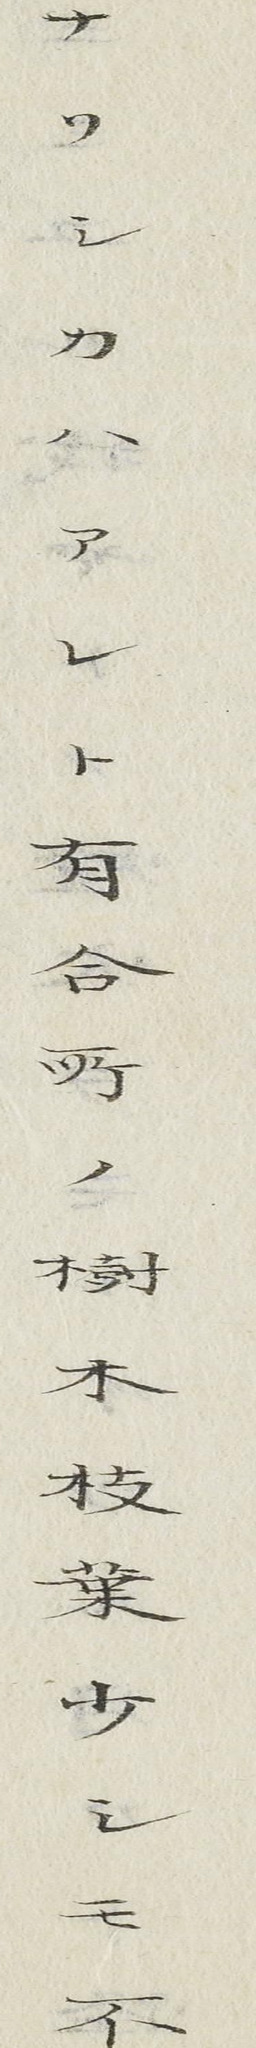ナリシカハアレト有合所ノ樹木枝葉少シモ不
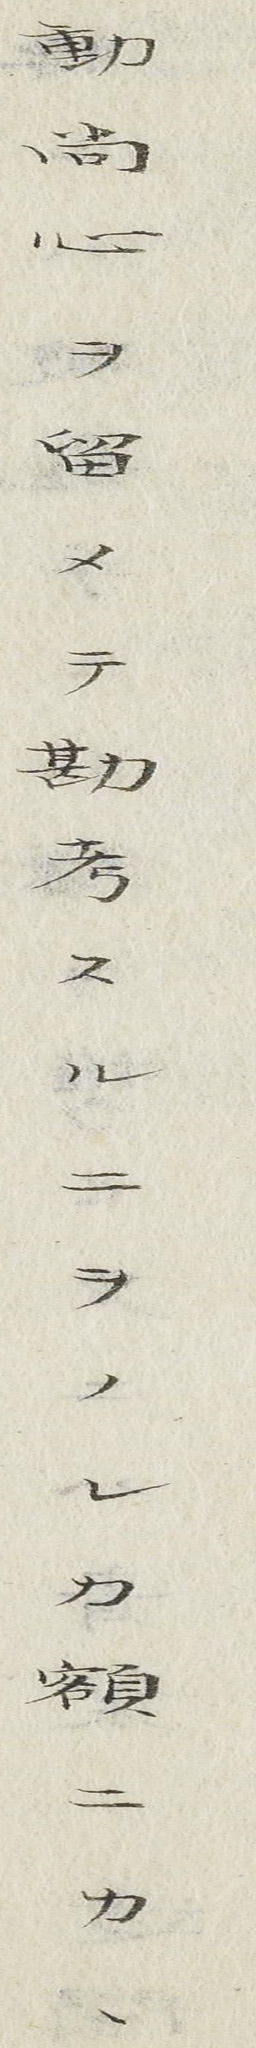動尚心ヲ留メテ勘考スルニヲノレカ額ニカヽ
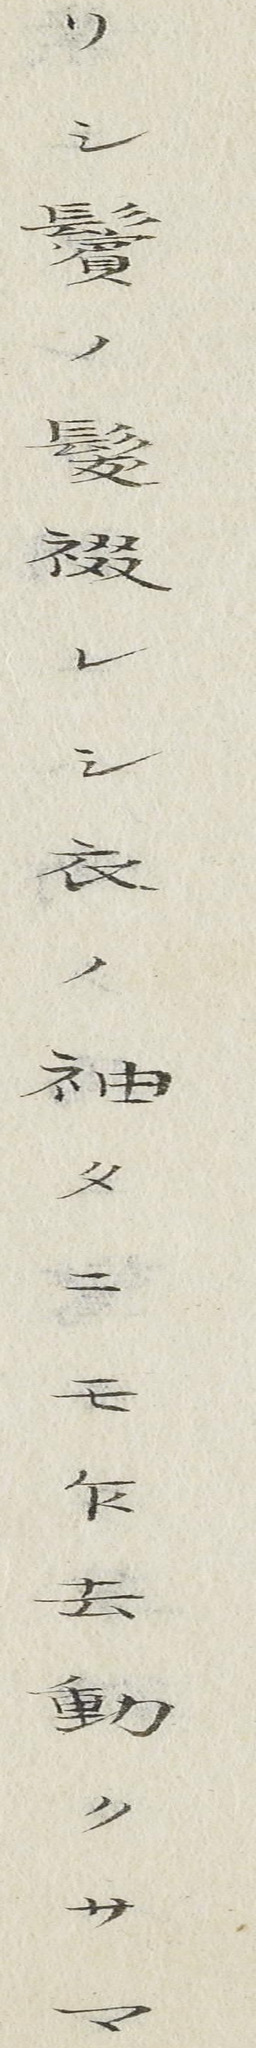リシ鬚ノ髪裰レシ衣ノ袖タニモ乍去動クサマ
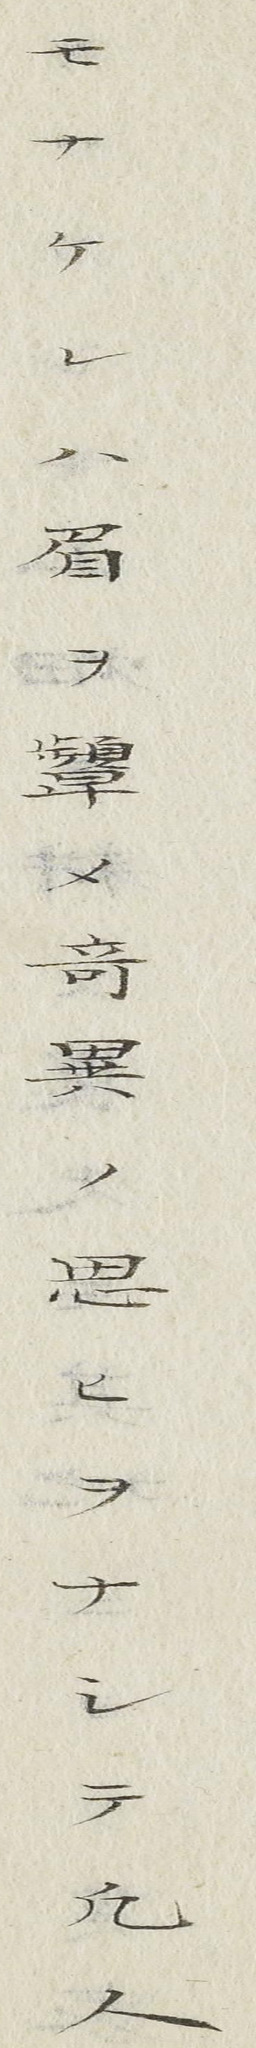モナケレハ眉ヲ顰メ奇異ノ思ヒヲナシテ凡人
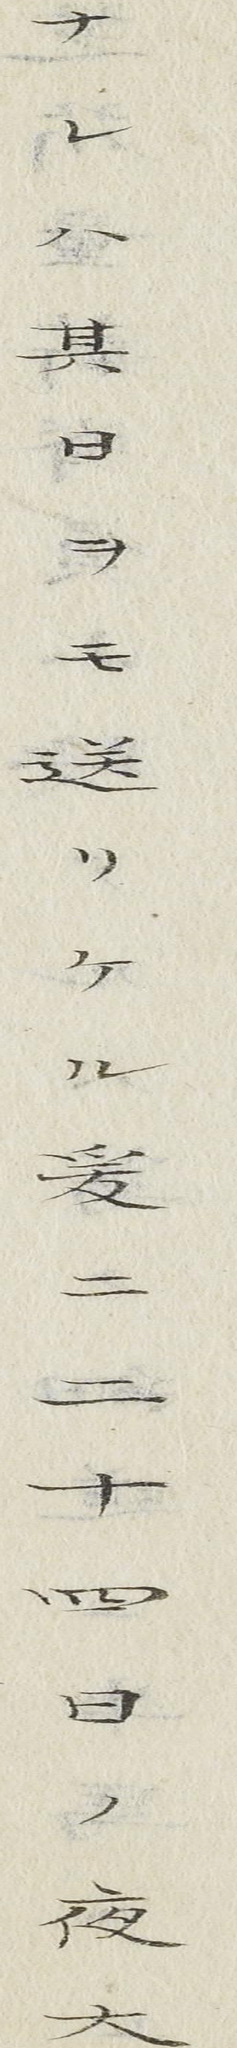ナレハ其日ヲモ送リケル爰ニ二十四日ノ夜大
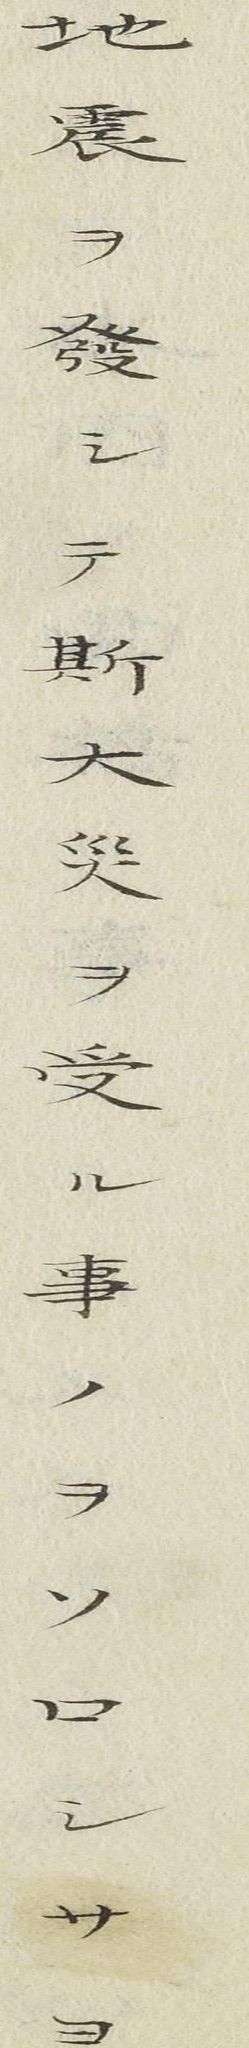地震ヲ発シテ斯大災ヲ受ル事ノヲソロシサヨ
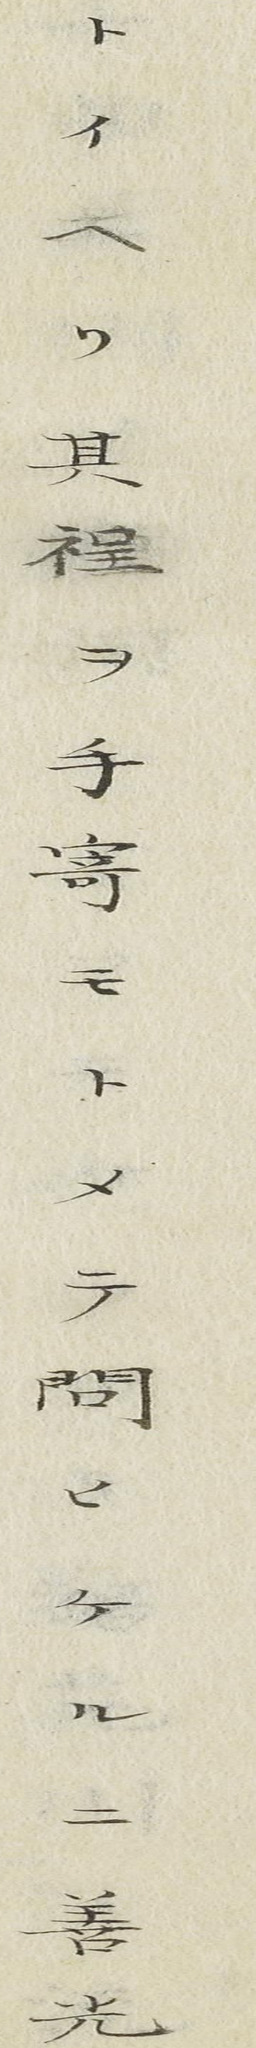トイヘリ其程ヲ手寄モトメテ問ヒケルニ善光
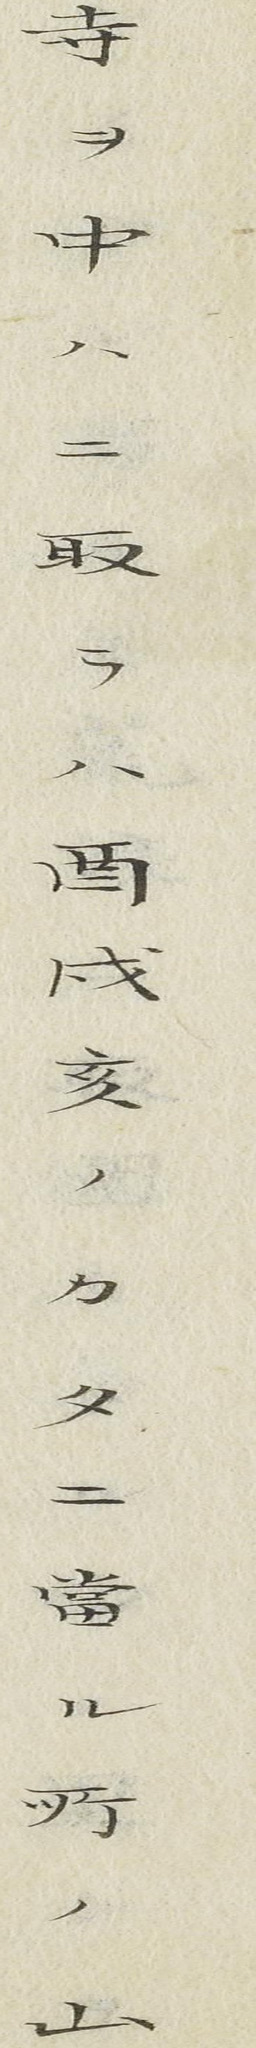寺ヲ中ハニ取ラハ酉戌亥ノカタニ当ル所ノ山
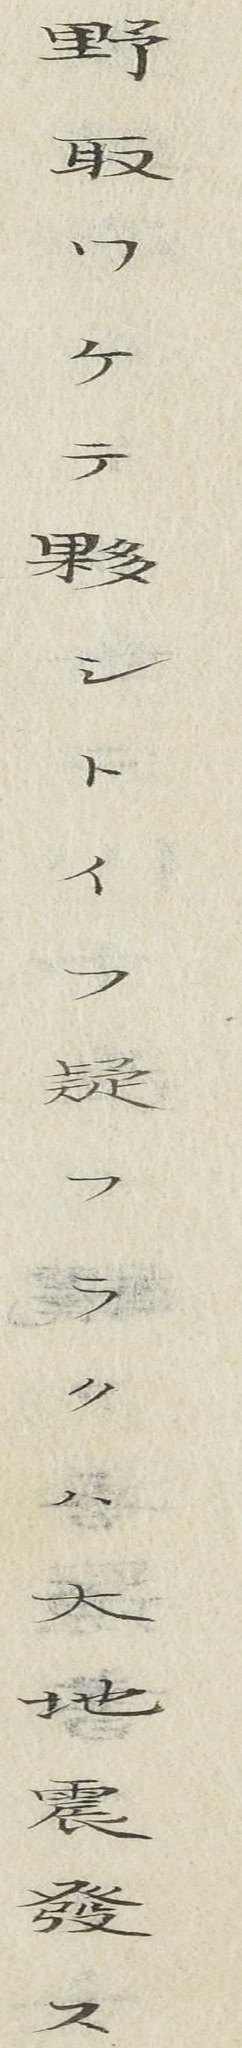野取ワケテ夥シトイフ疑フラクハ大地震発ス
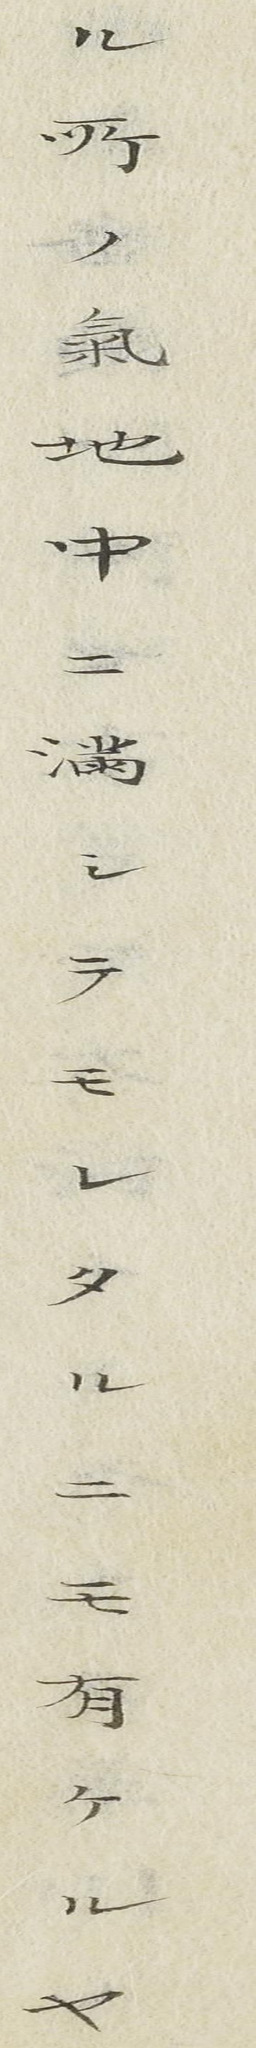ル所ノ気地中ニ満シテモレタルニモ有ケルヤ
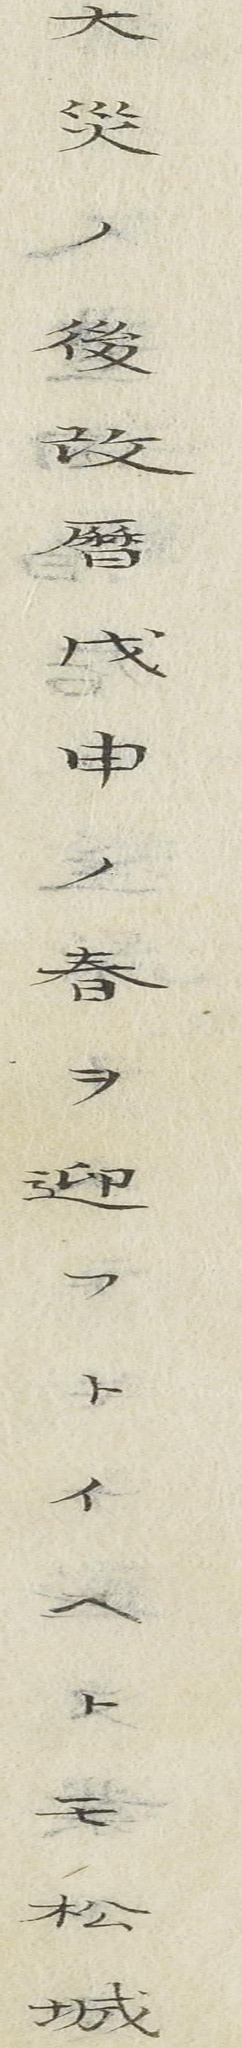大災ノ後改暦戌申ノ春ヲ迎フトイヘトモ松城
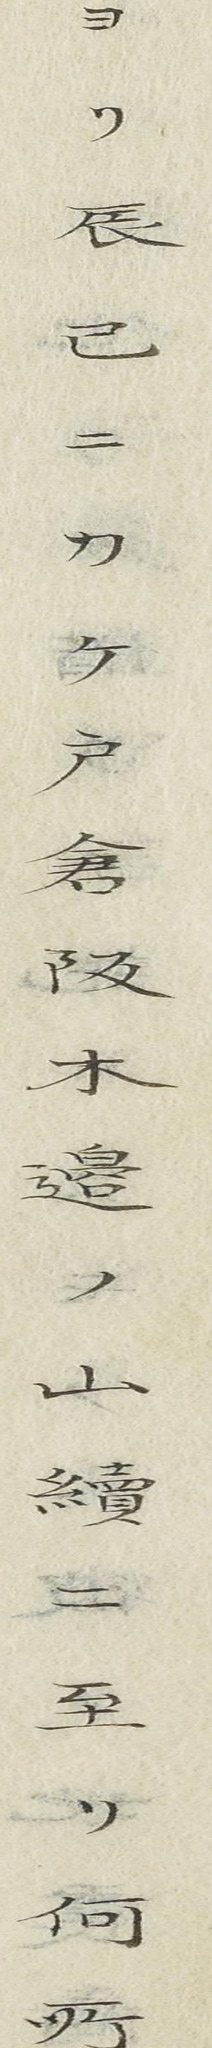ヨリ辰巳ニカケ戸倉阪木辺ノ山続ニ至リ何所
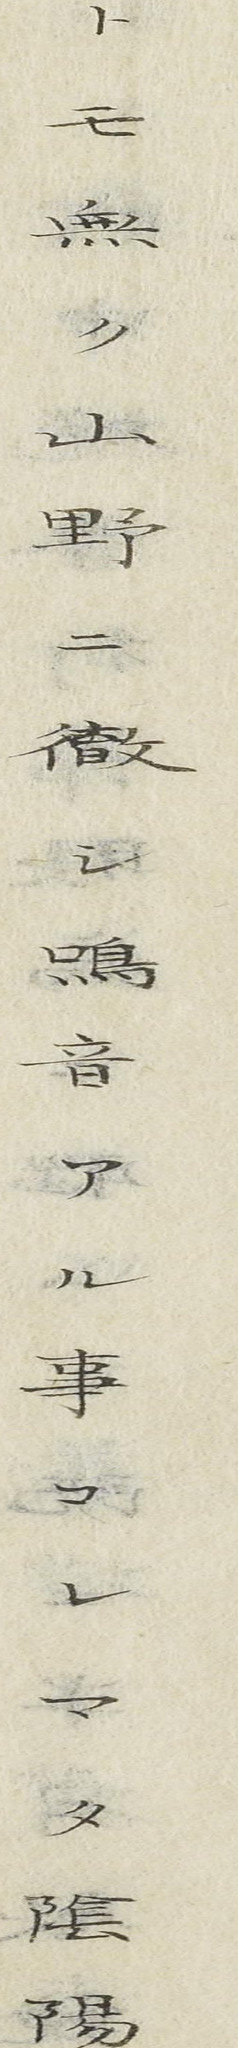トモ無ク山野ニ徹シ鳴音アル事コレマタ陰陽
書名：地災撮要　地震之部　巻ノ二
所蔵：東京大学地震研究所図書室 Earthquake Research Institute Library, The University of Tokyo, JAPAN
